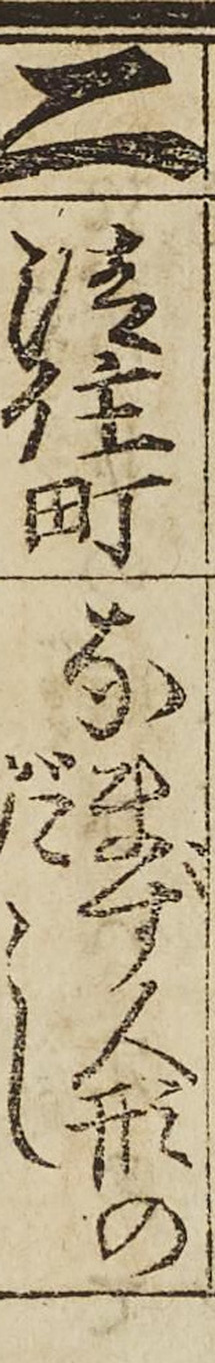二清住町なまず人形の
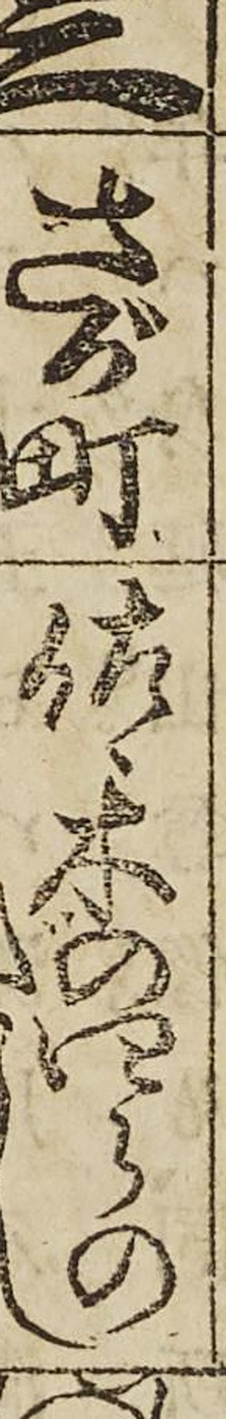三さが町佐ヽ木の四郎の
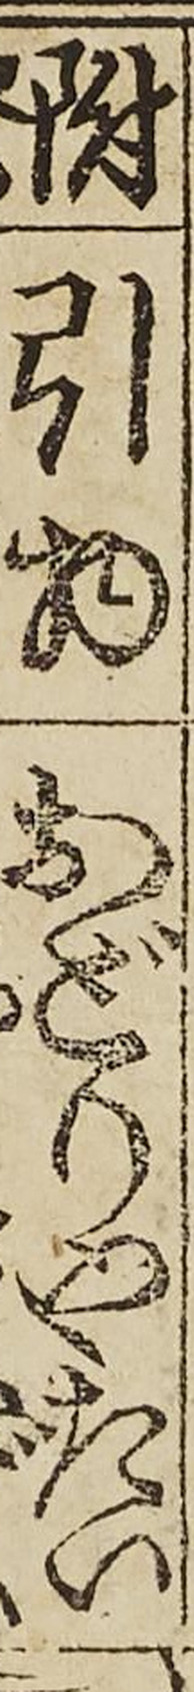附引物おどりやたい
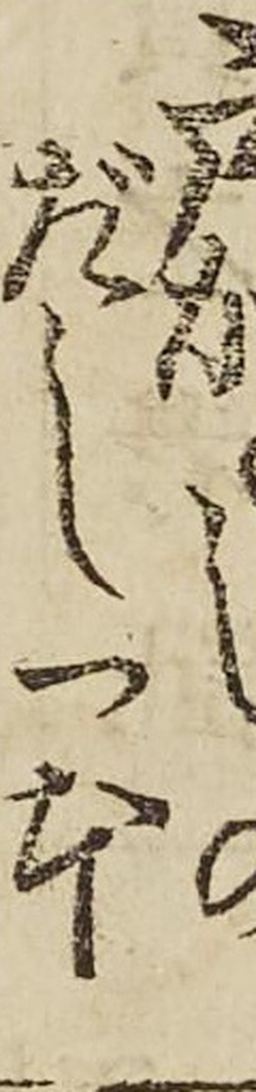だし一本
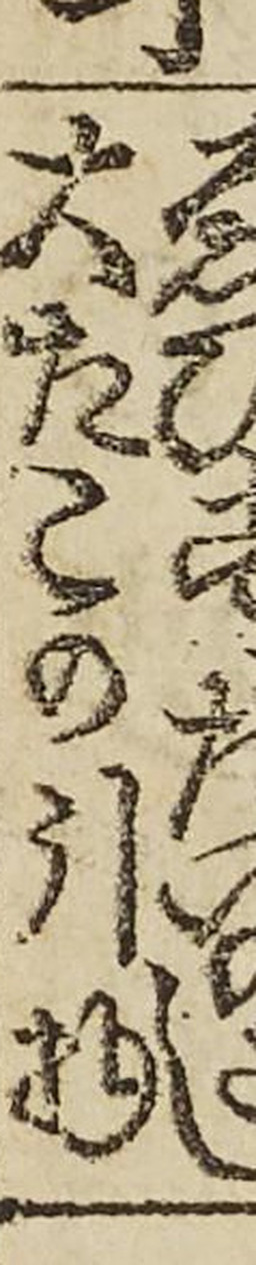大たこの引物
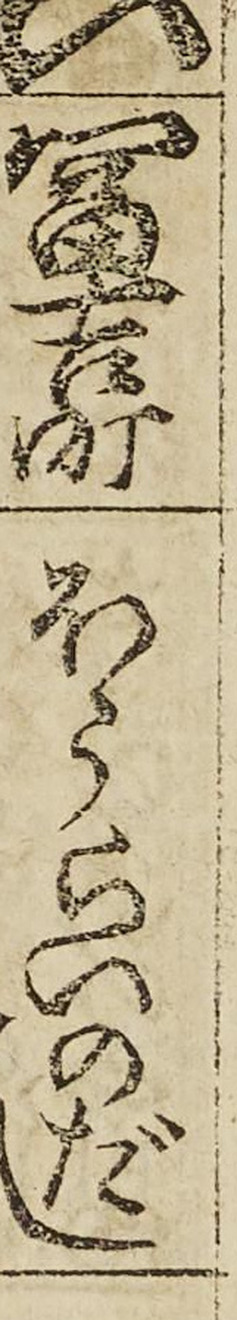六冨吉町ほうらいのだ
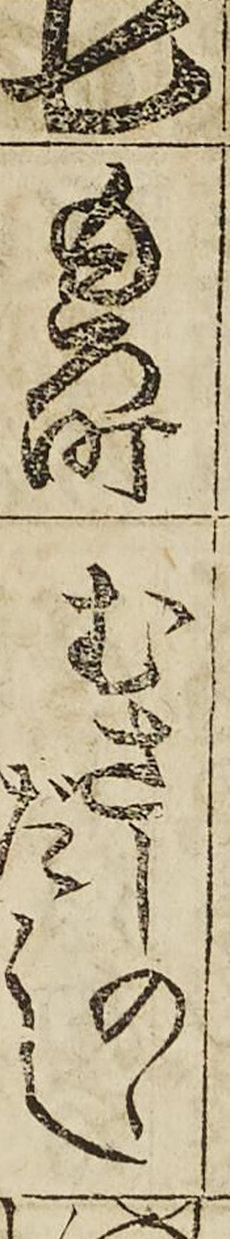七もろ町むさしのゝ
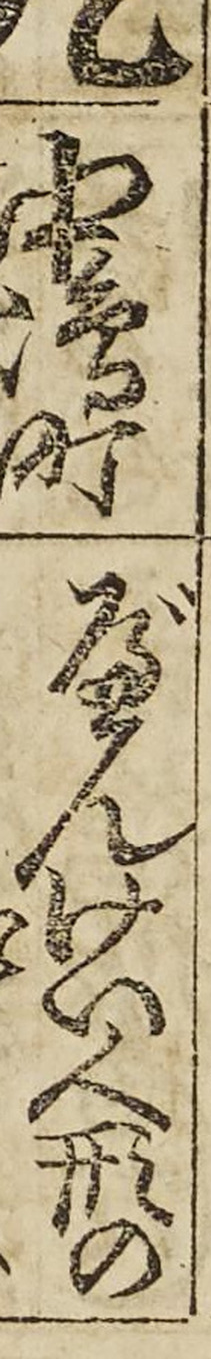九中嶋町べんけい人形の

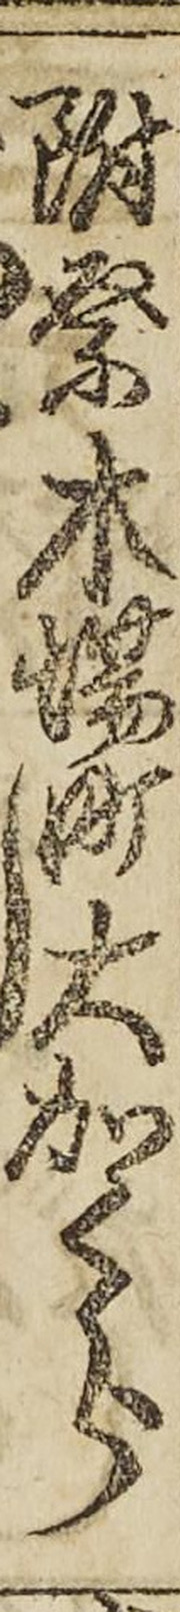附祭木場町大かくら
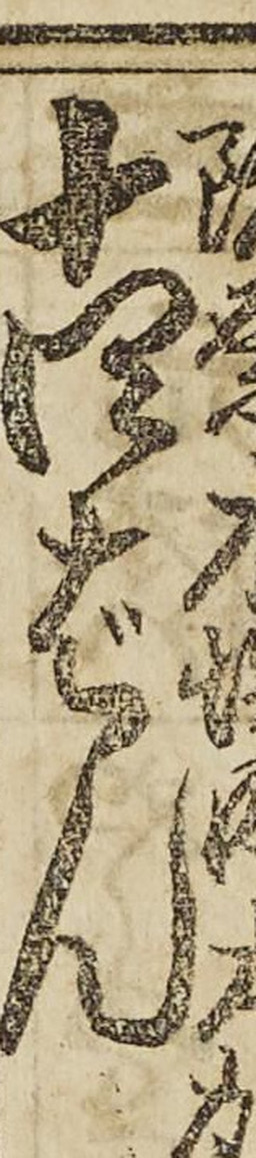十四ばん
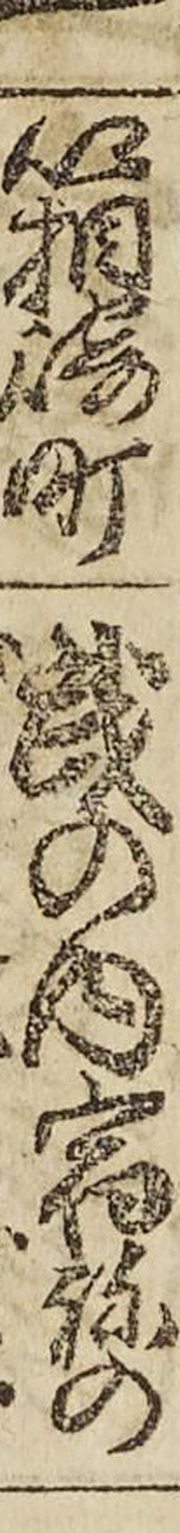一以相崎町武の内宿祢の
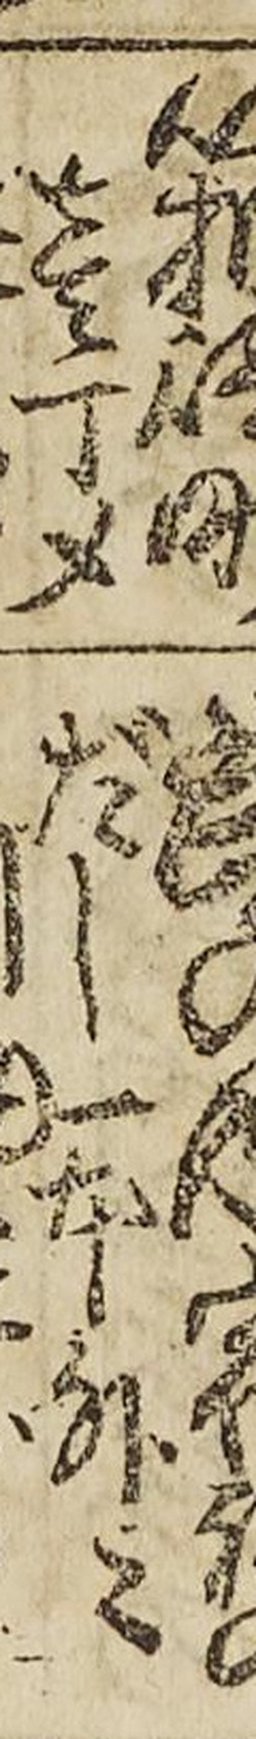壱丁メだし一本外に
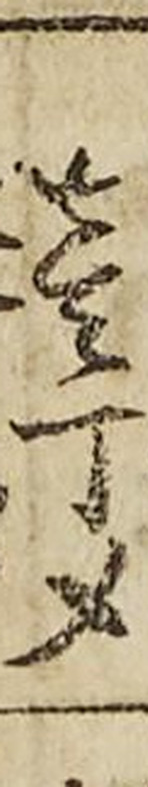二丁メ
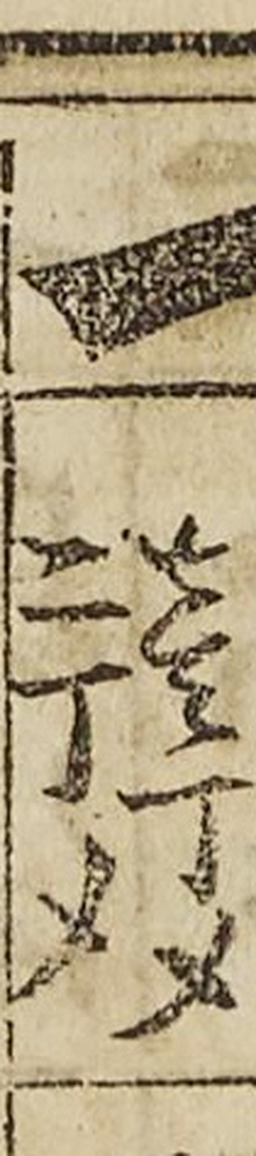二丁メ
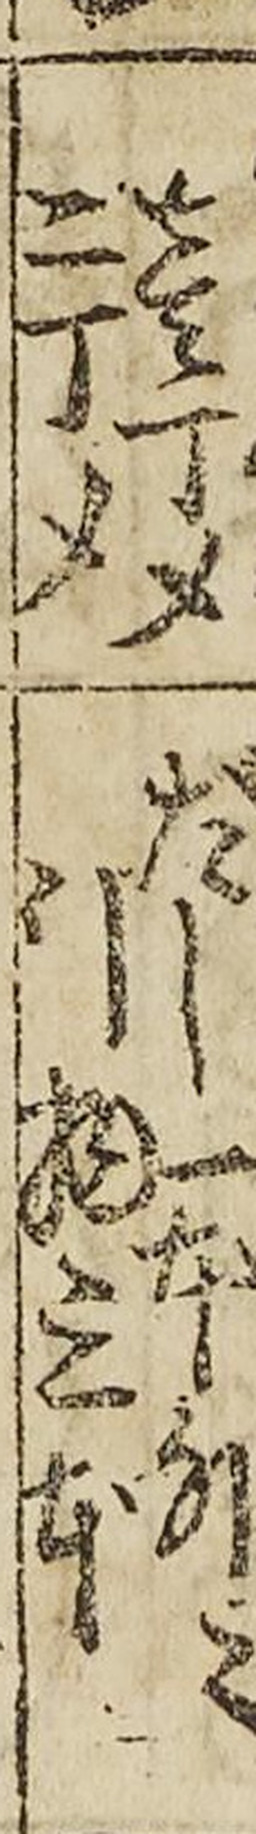二丁メ引物三本
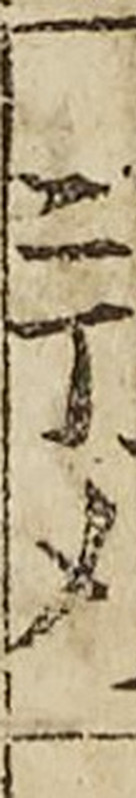二丁メ
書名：永代惨話　文化の夢　全
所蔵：東京大学地震研究所図書室 Earthquake Research Institute Library, The University of Tokyo, JAPAN
